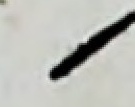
1
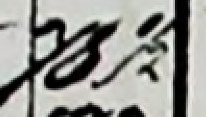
78½
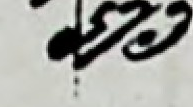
573
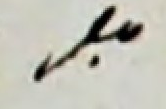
do
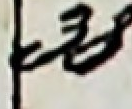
38
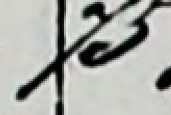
75
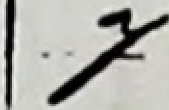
7
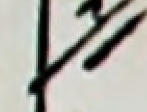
71
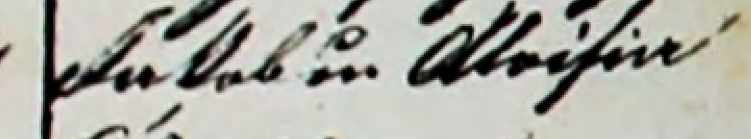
Jakob u. Aloisia
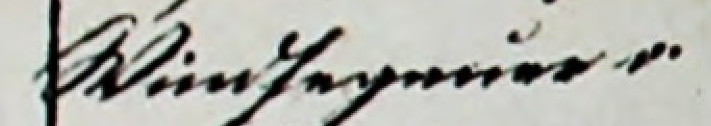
Windsegauer v.
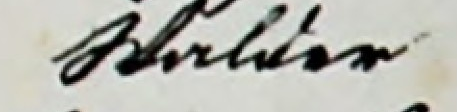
Walder
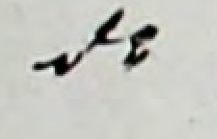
do
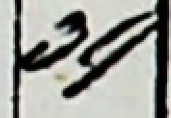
39
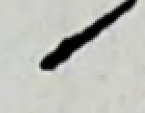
1
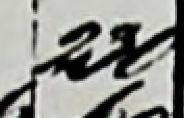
230
